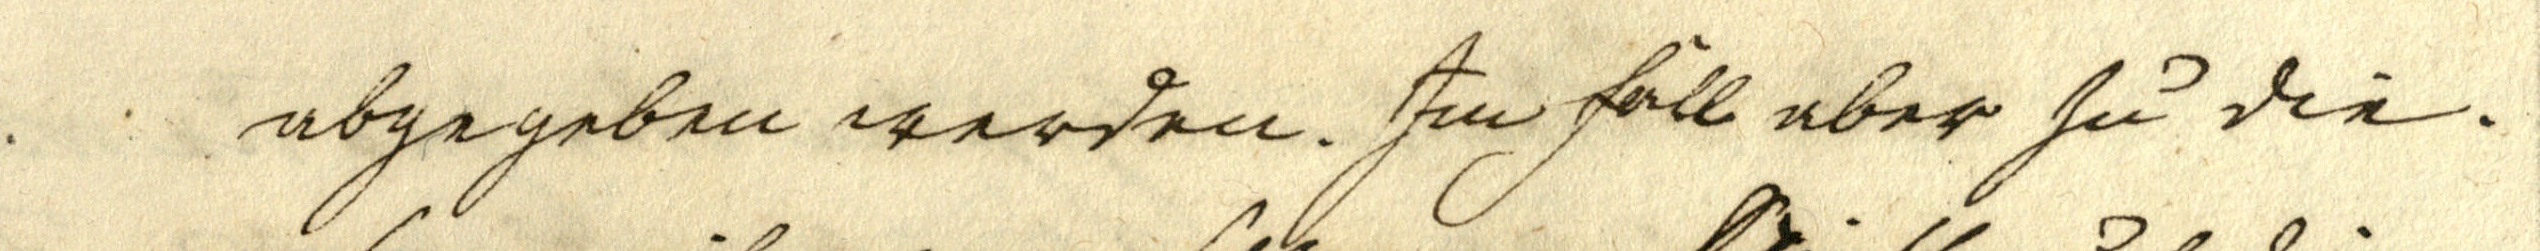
abgegeben werden. Im Fall aber zu die-
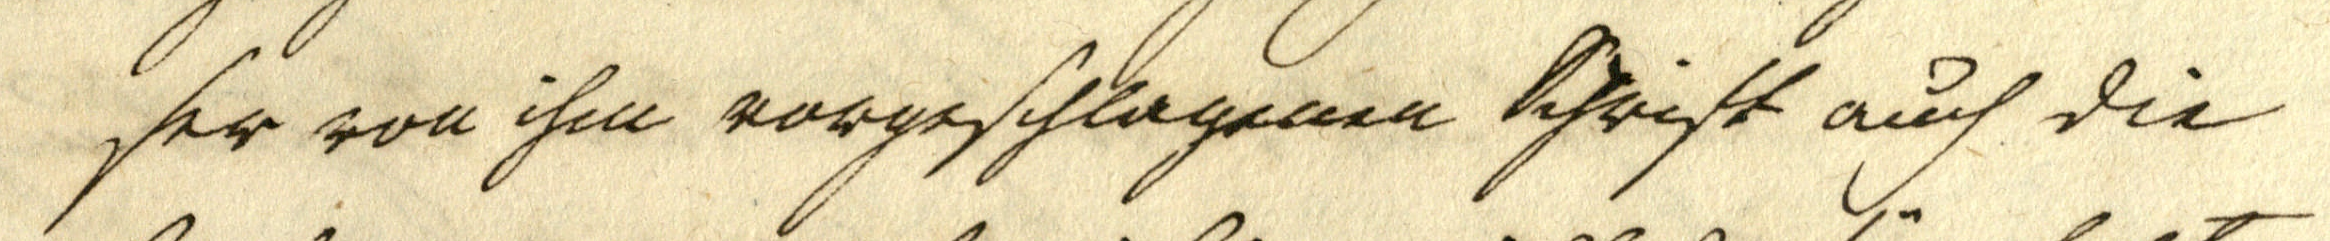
ser von ihm vorgeschlagenen Schrift auch die
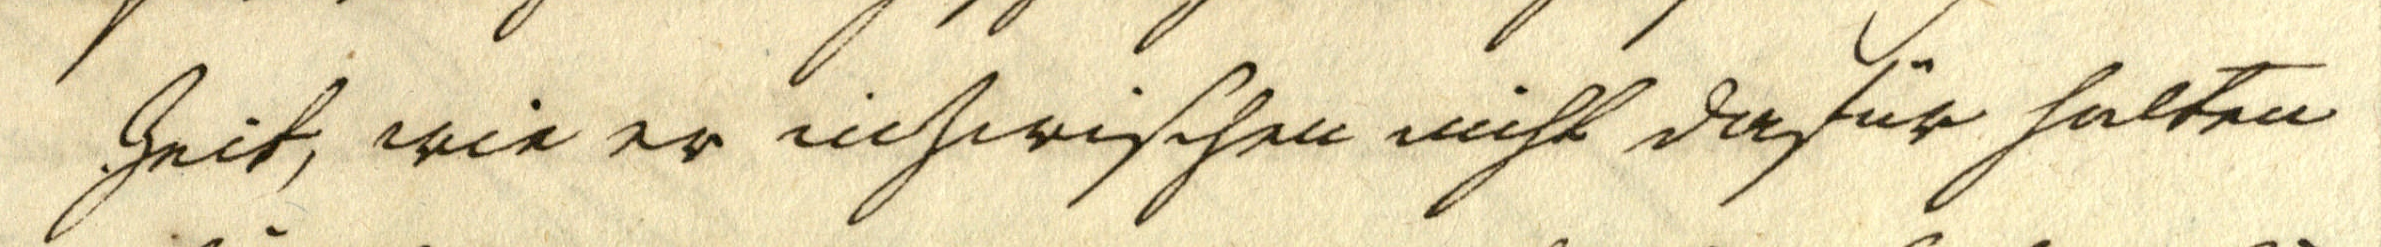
Zeit, wie er inzwischen nicht dafür halten
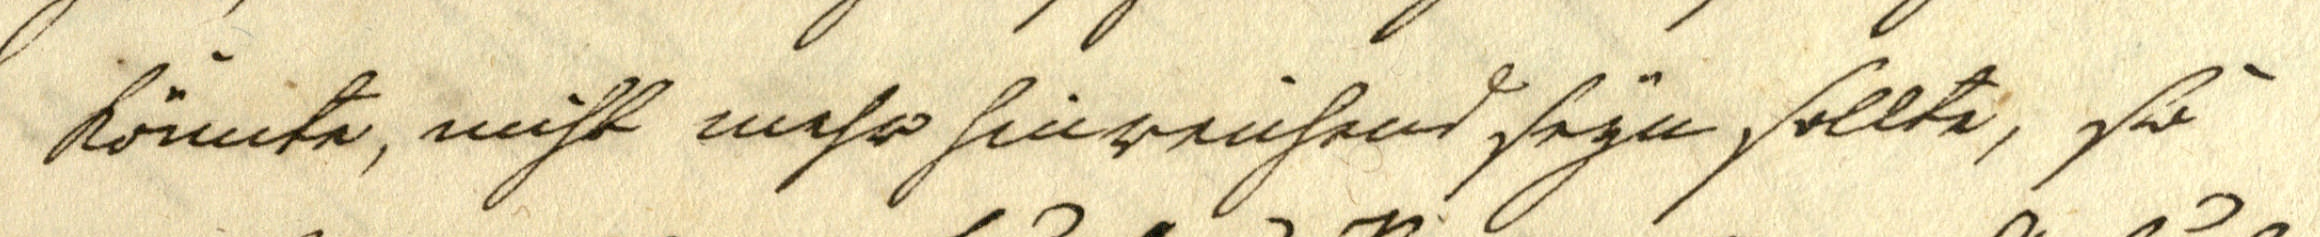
könnte, nicht mehr hinreichend seyn sollte, so
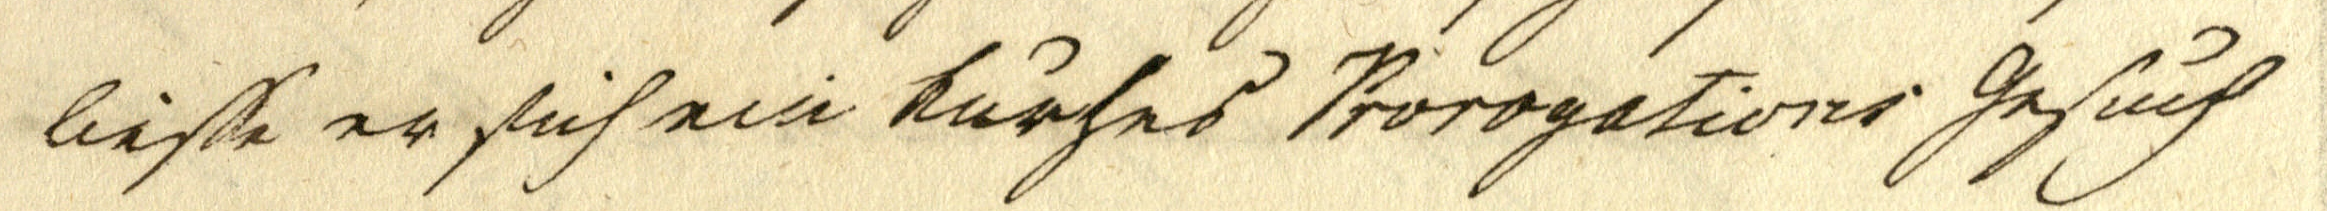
liesse er sich ein kurzes Prorogations Gesuch
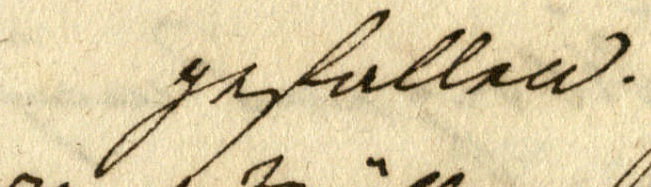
gefallen.
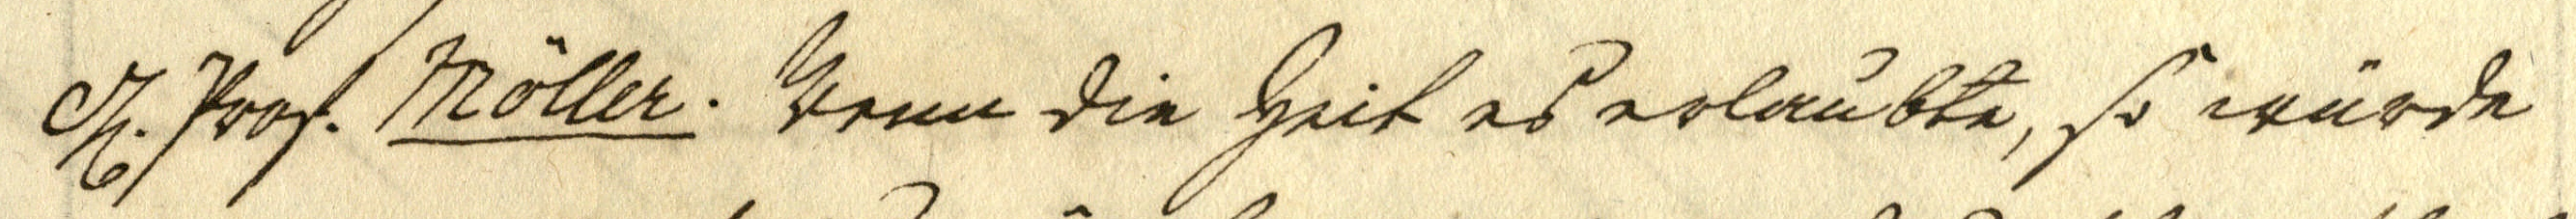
dh. Prof. Möller. Wenn die Zeit es erlaubte, so würde
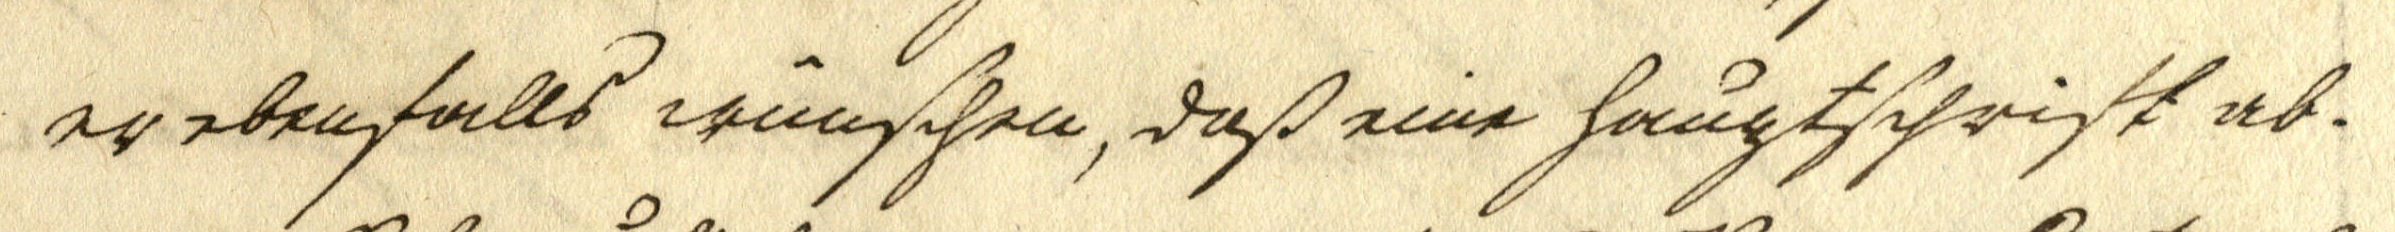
er ebenfalls wünschen, daß eine Hauptschrift ab-
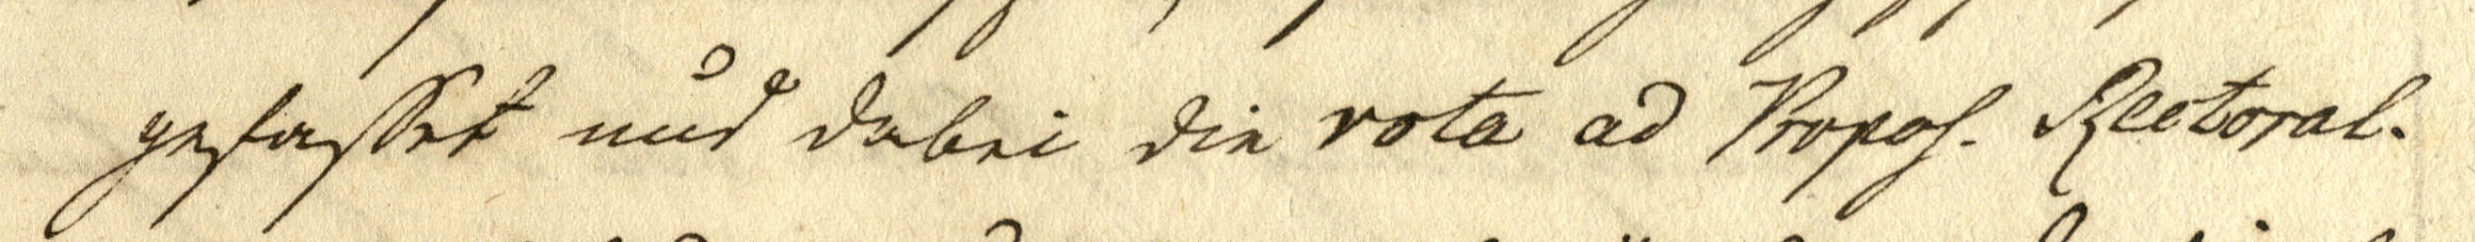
gefasset und dabei die vota ad Propos. Rectoral.
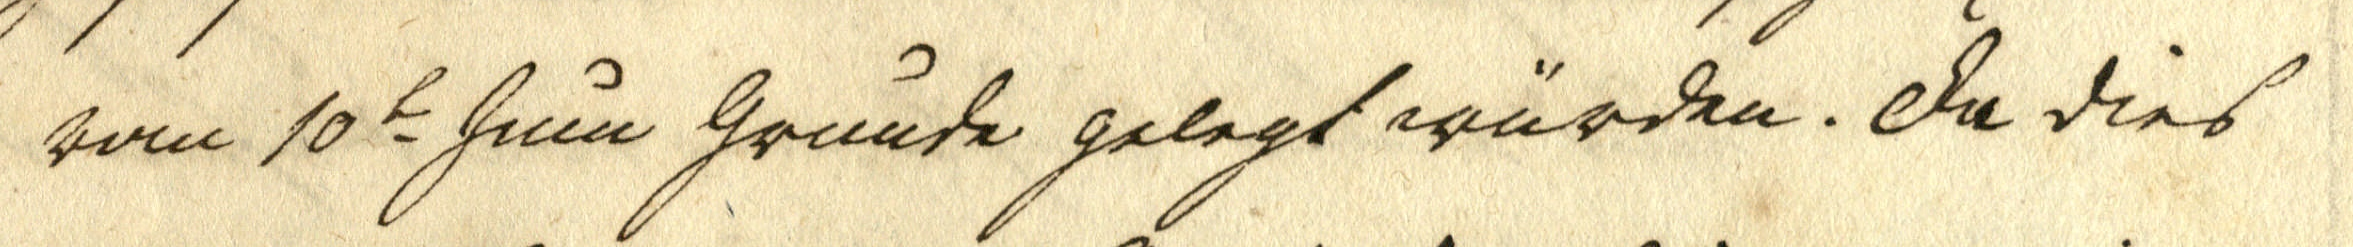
vom 10ten zum Grunde gelegt würden. Da dies
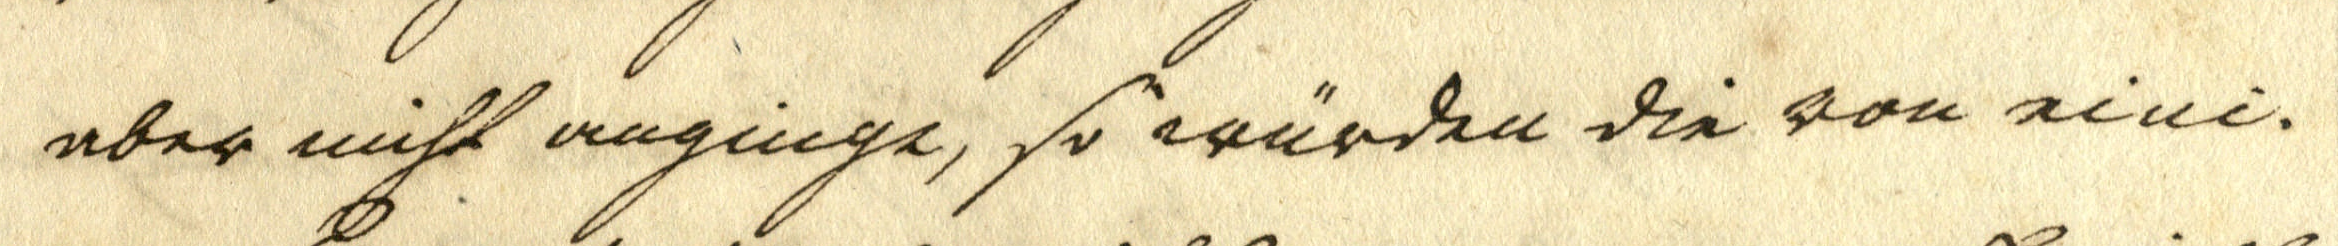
aber nicht anginge, so würden die von eini-
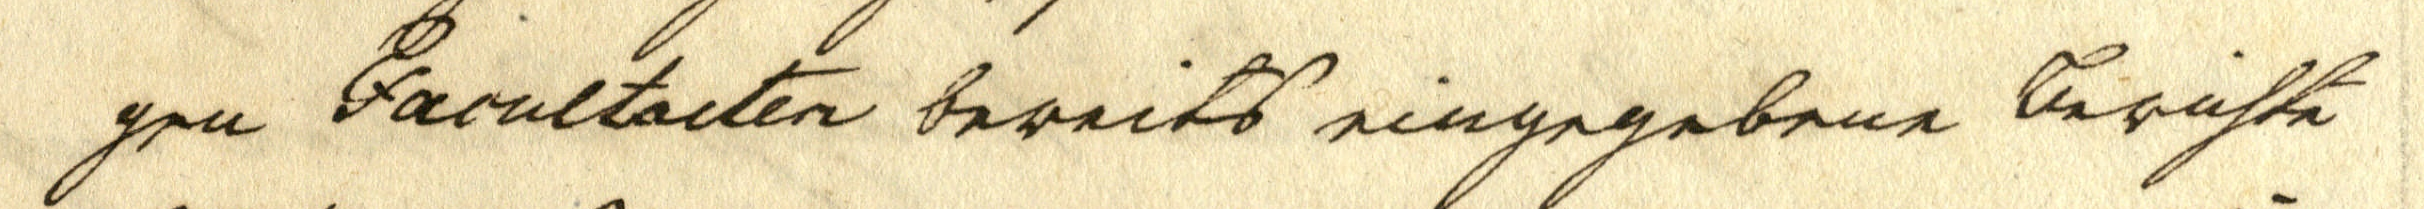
gen Facultaeten bereits eingegebene Berichte
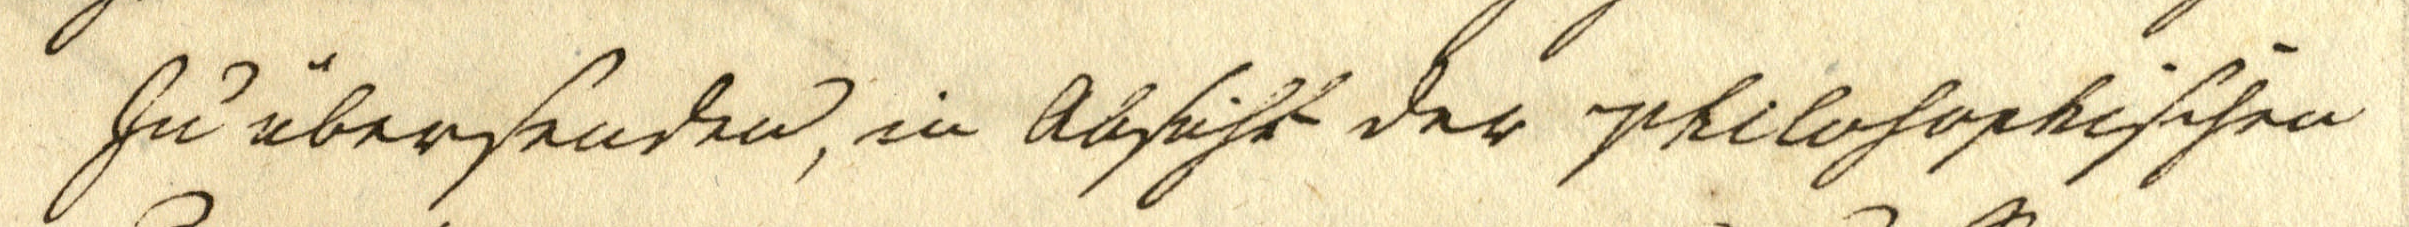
zu übersenden, in Absicht der philosophischen
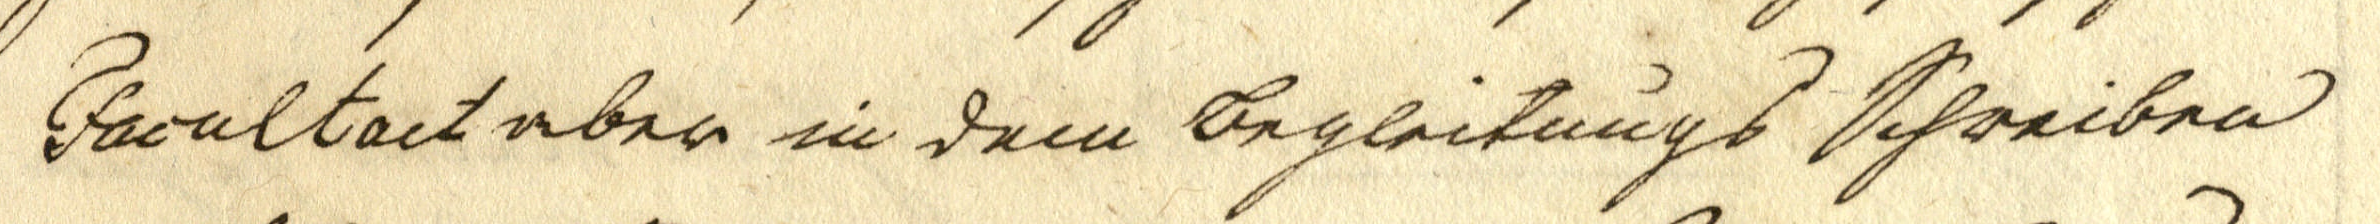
Facultaet aber in dem Begleitungs Schreiben
